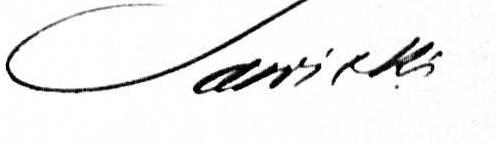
Sawicki
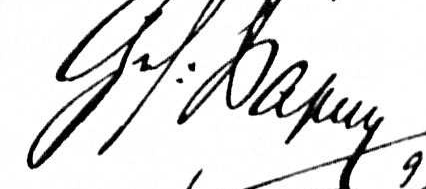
Ges. Papay
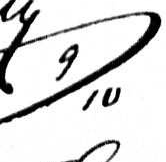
9/10
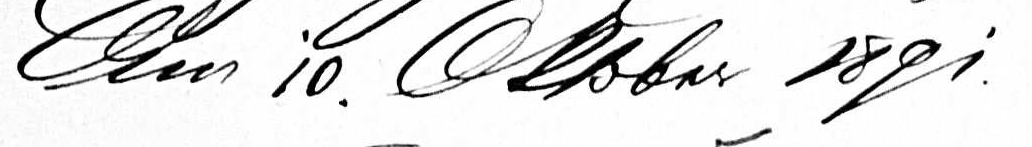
Am 10. Oktober 1891
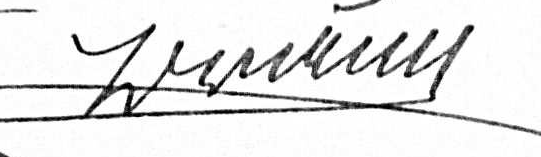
Braun
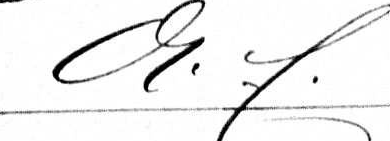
A. E.
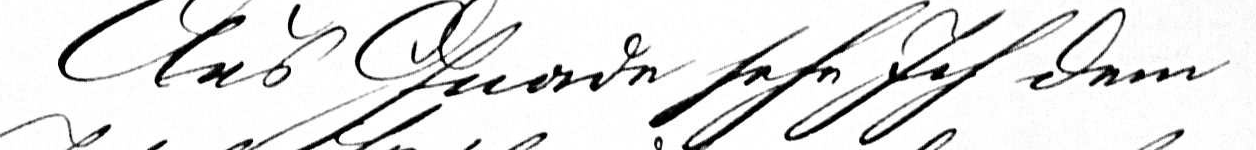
Aus Gnade sehe Ich de
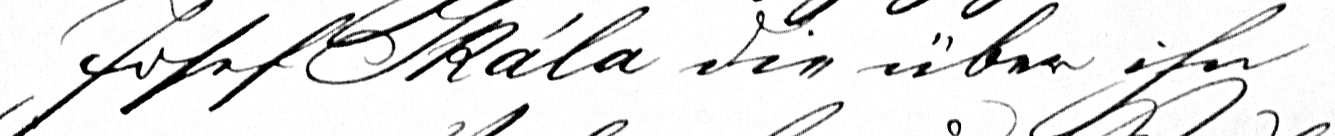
Josef Skála die über ihn
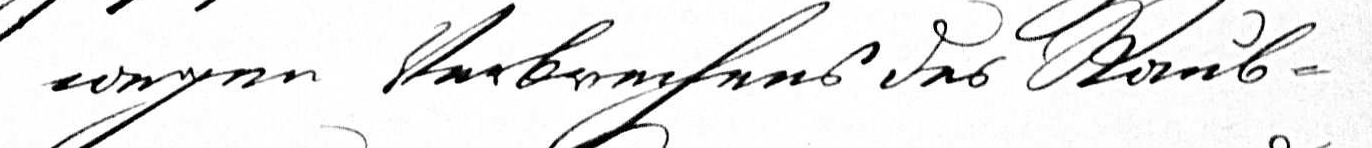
wegen Verbrechens des Raub¬
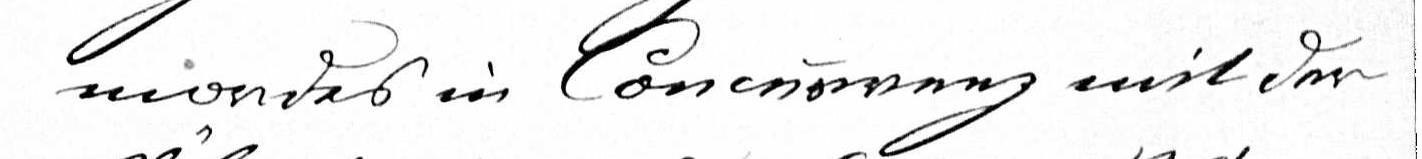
mordes in Concurrenz mit der
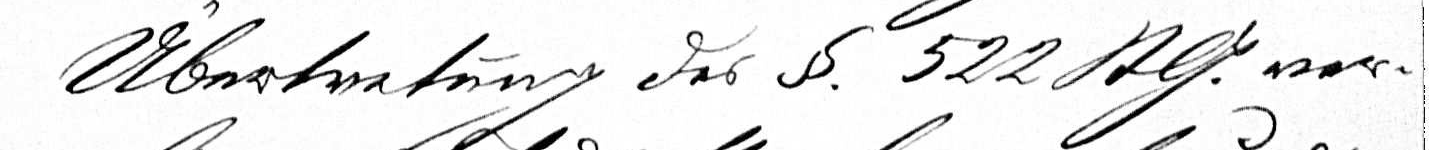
Übertretung des §522 StG ver¬
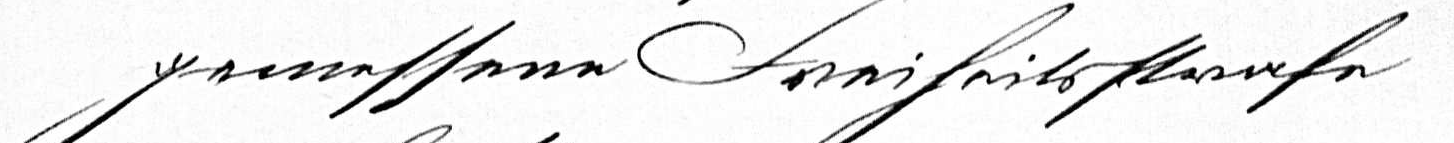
gemessene Freiheitsstrafe
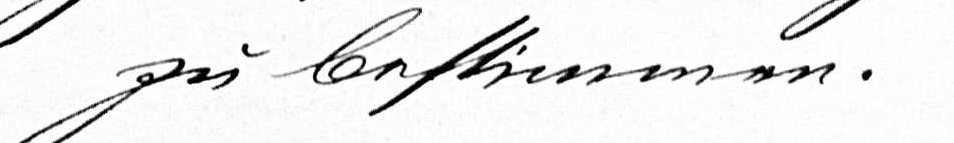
zu bestimmen.
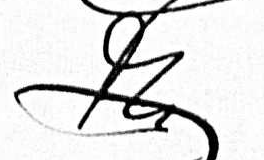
FJ
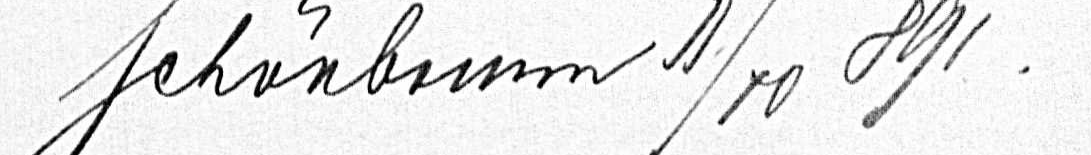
Schönbrunn 11/10 1891
